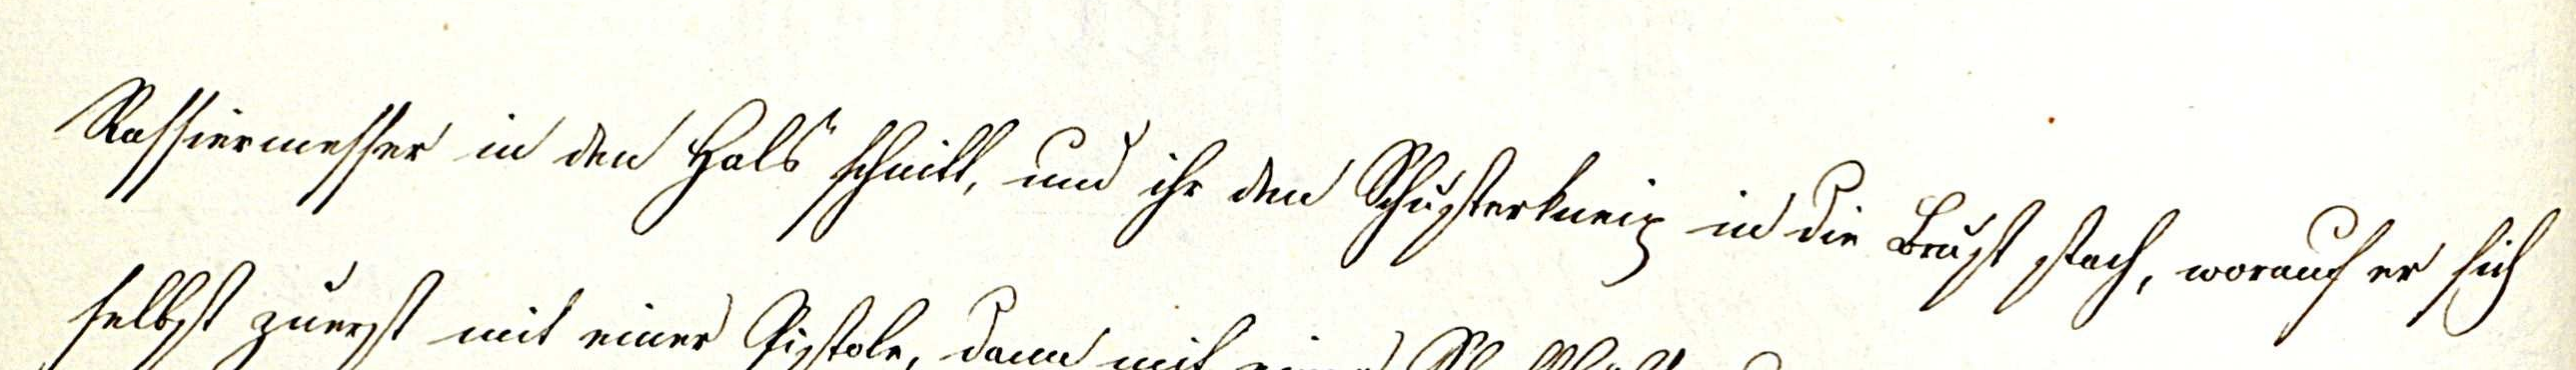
Rassiermesser in den Hals schnitt, und ihr den Schusterkneife in die Brust stach, worauf er sich
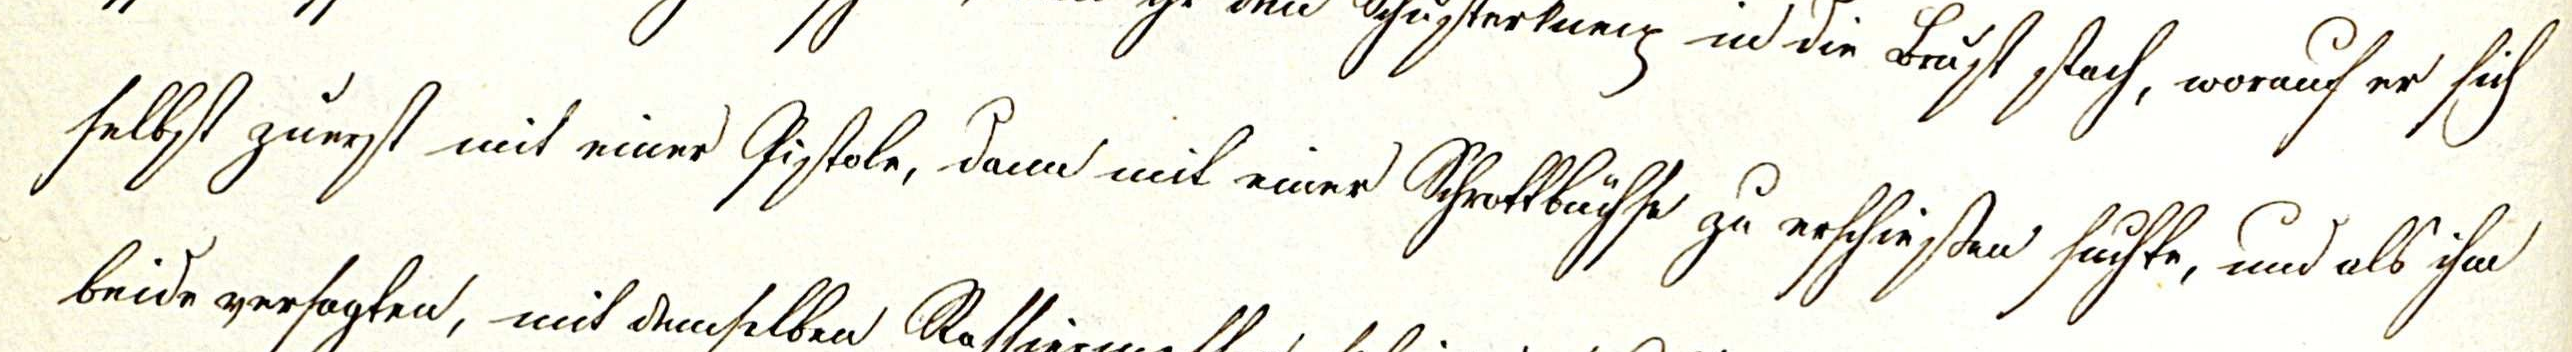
selbst zuerst mit einer Pistole, dann mit einer Schrottbüchse zu erschießen suchte, und als ihm
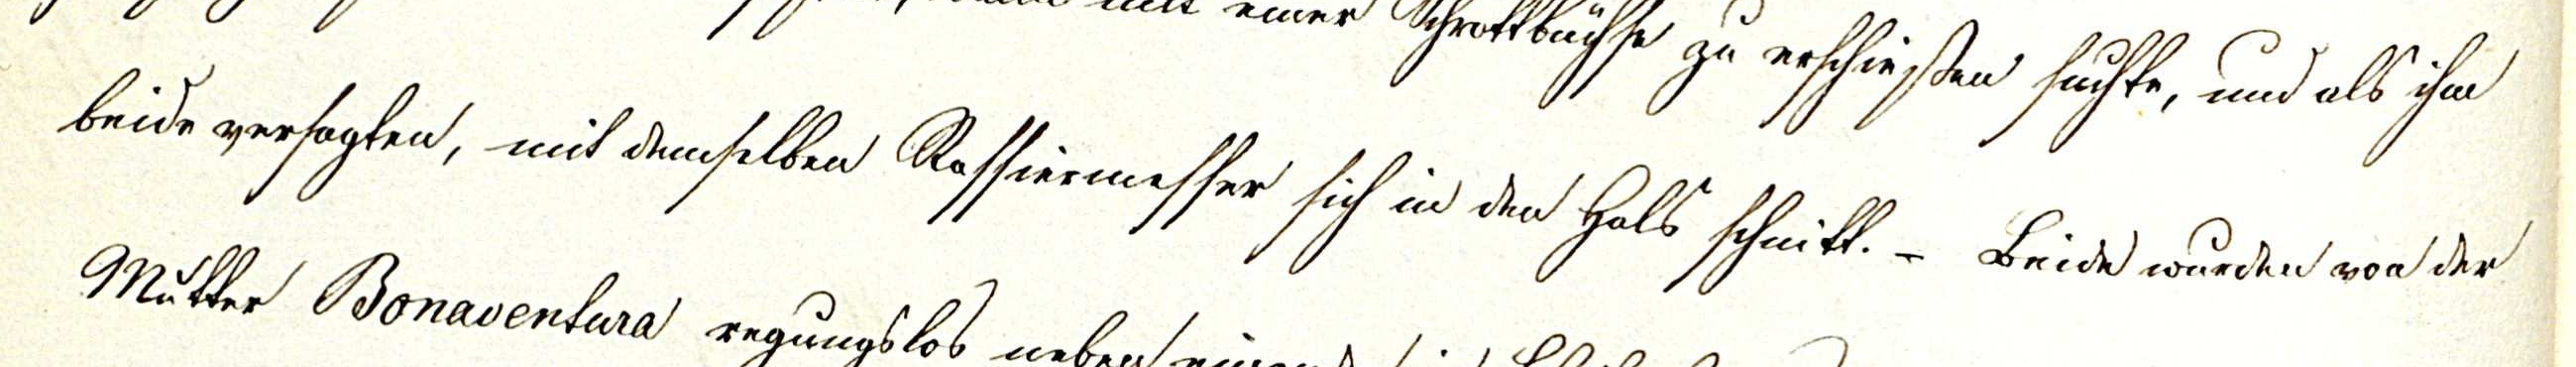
beide versagten, mit demselben Rassiermesser sich in den Hals schnitt. Beide wurden von der
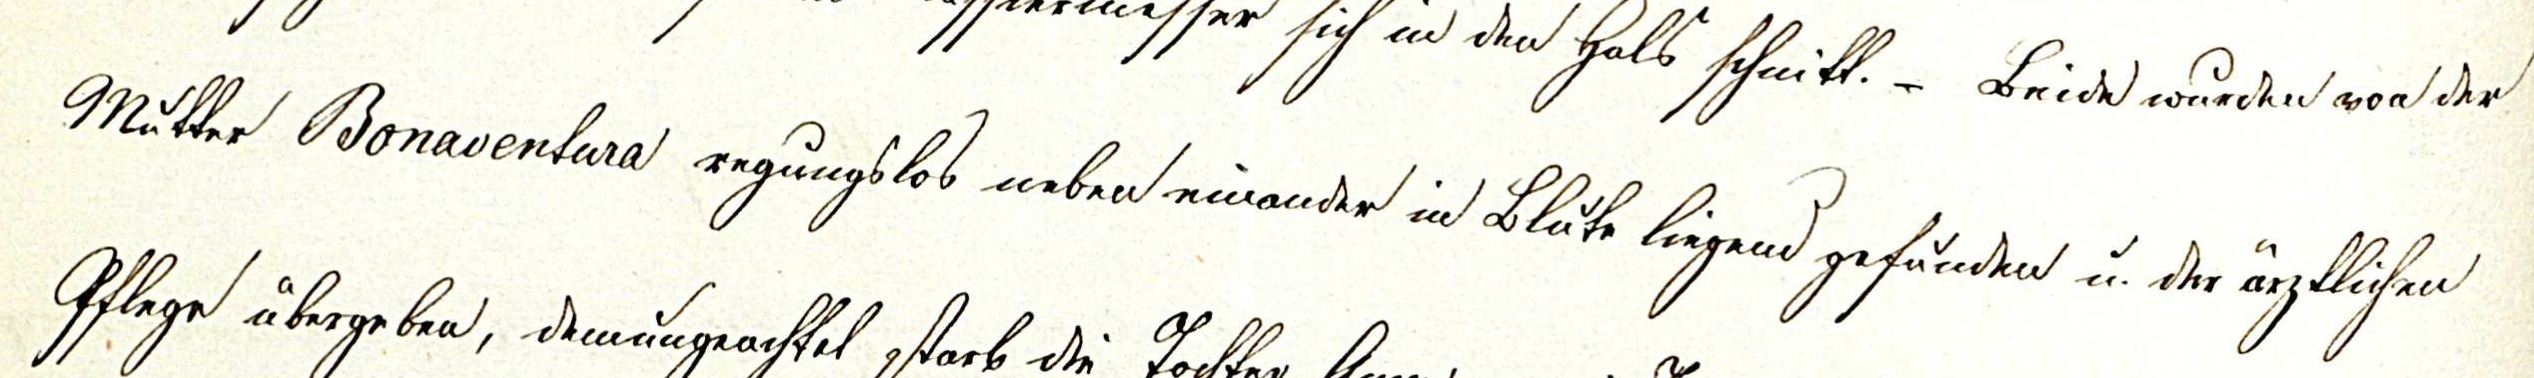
Mutter Bonaventura regungslos neben einander in Blute liegend gefunden u. der ärztlichen
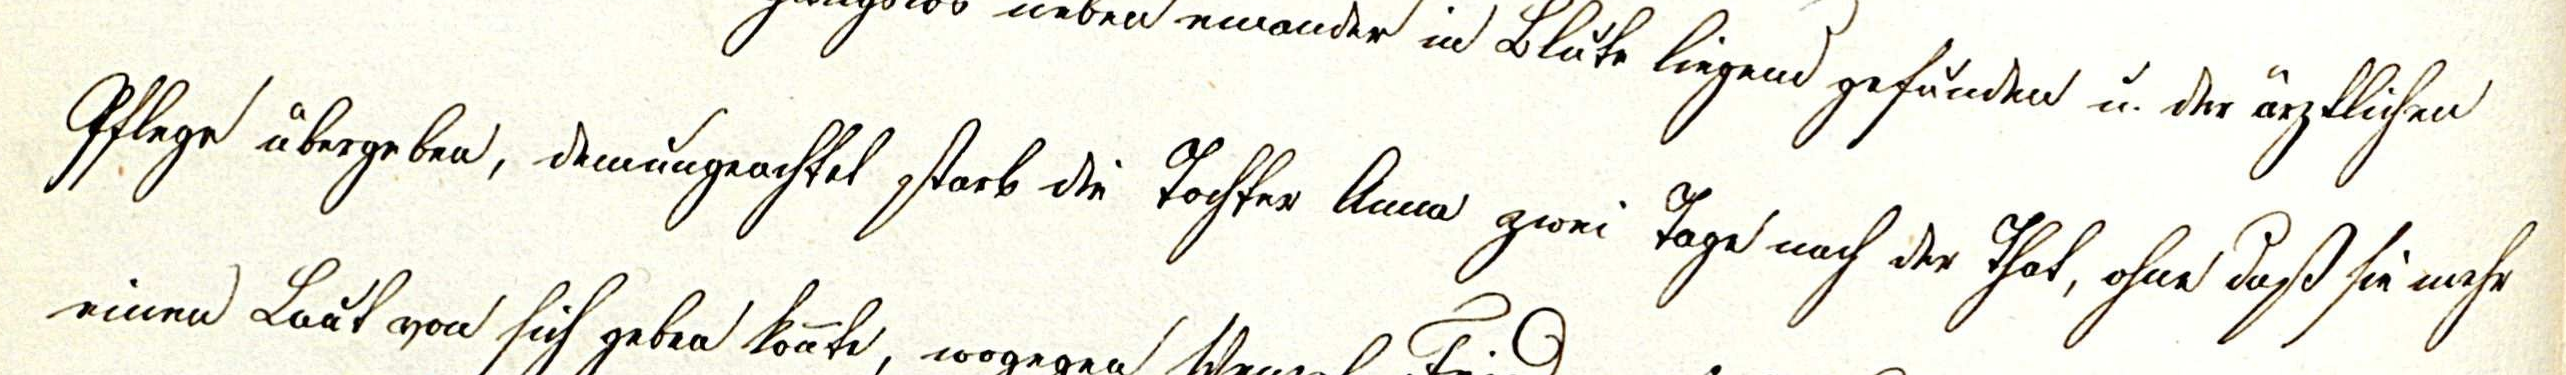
Pflege übergeben, demungeachtet starb die Tochter Anna zwei Tage nach der That, ohne daß sie mehr
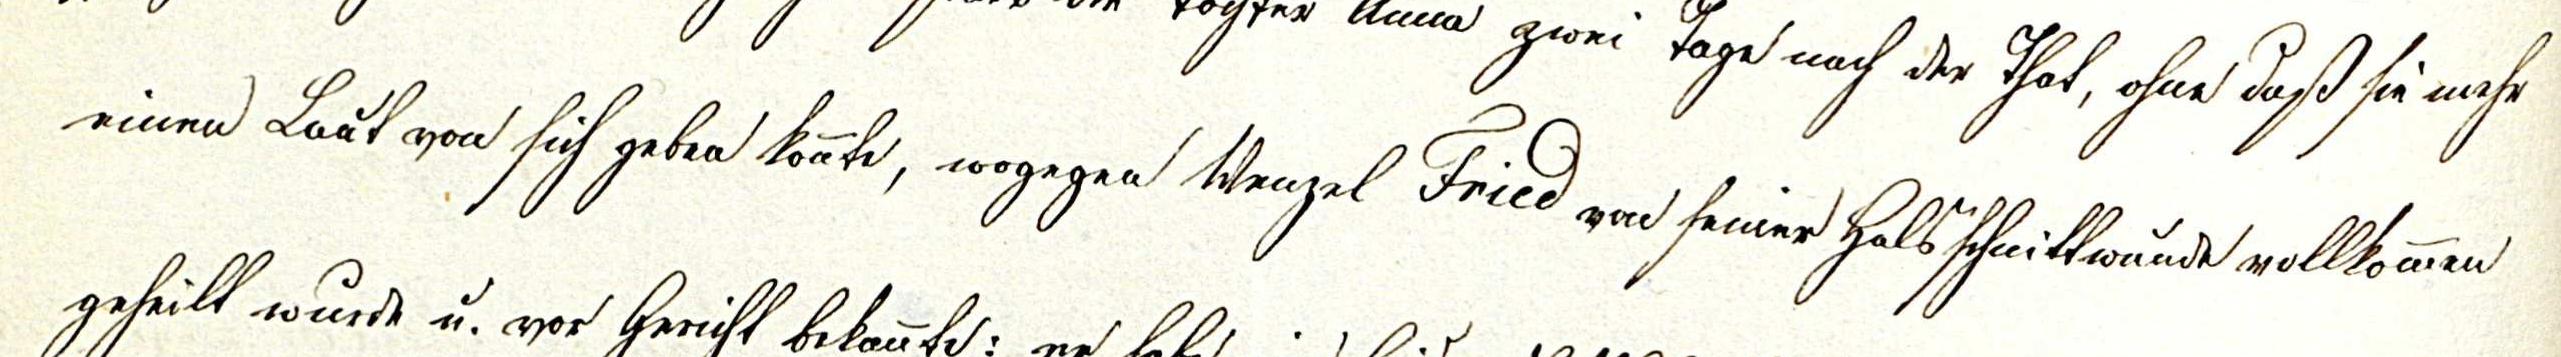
einen Laut von sich geben konnte, wogegen Wenzel Fried von seiner Halsschnittwunde vollkommen
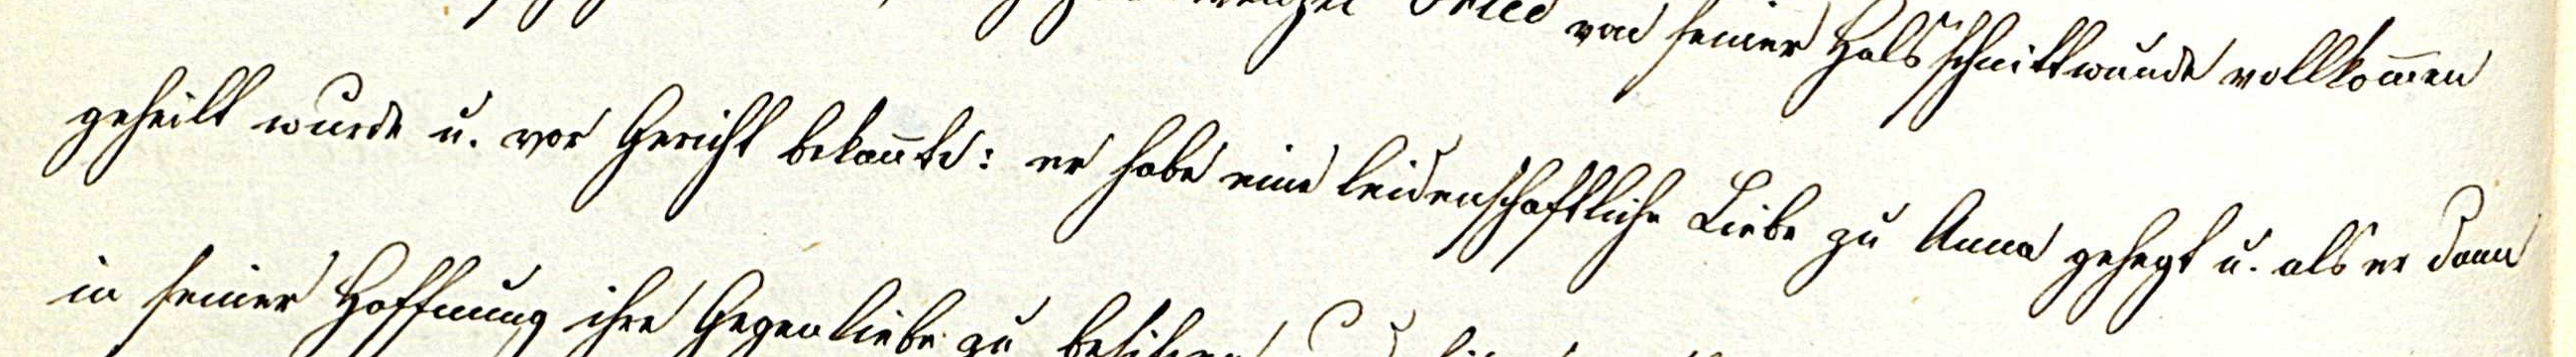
geheilt wurde u. vor Gericht bekannte: er habe eine leidenschaftliche Liebe zu Anna gehegt u. als er dann
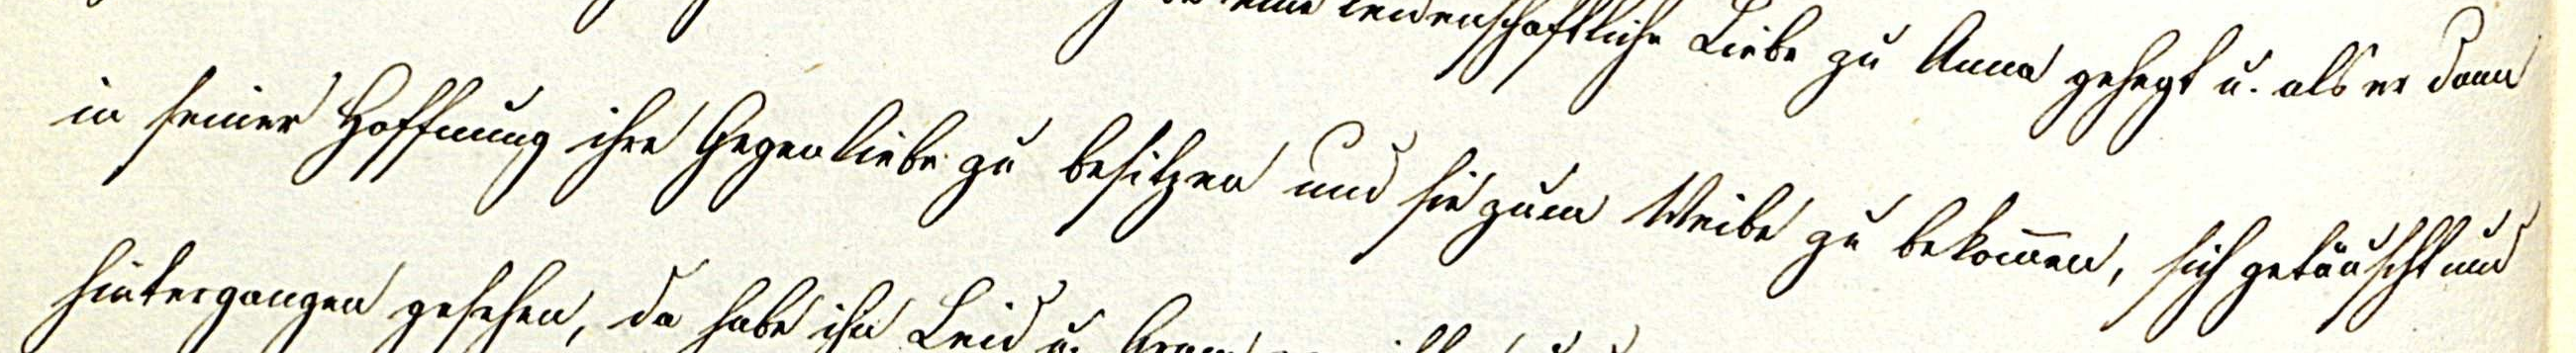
in seiner Hoffnung ihre Gegenliebe zu besitzen und sie zum Weibe zu bekommen, sich getäuscht und
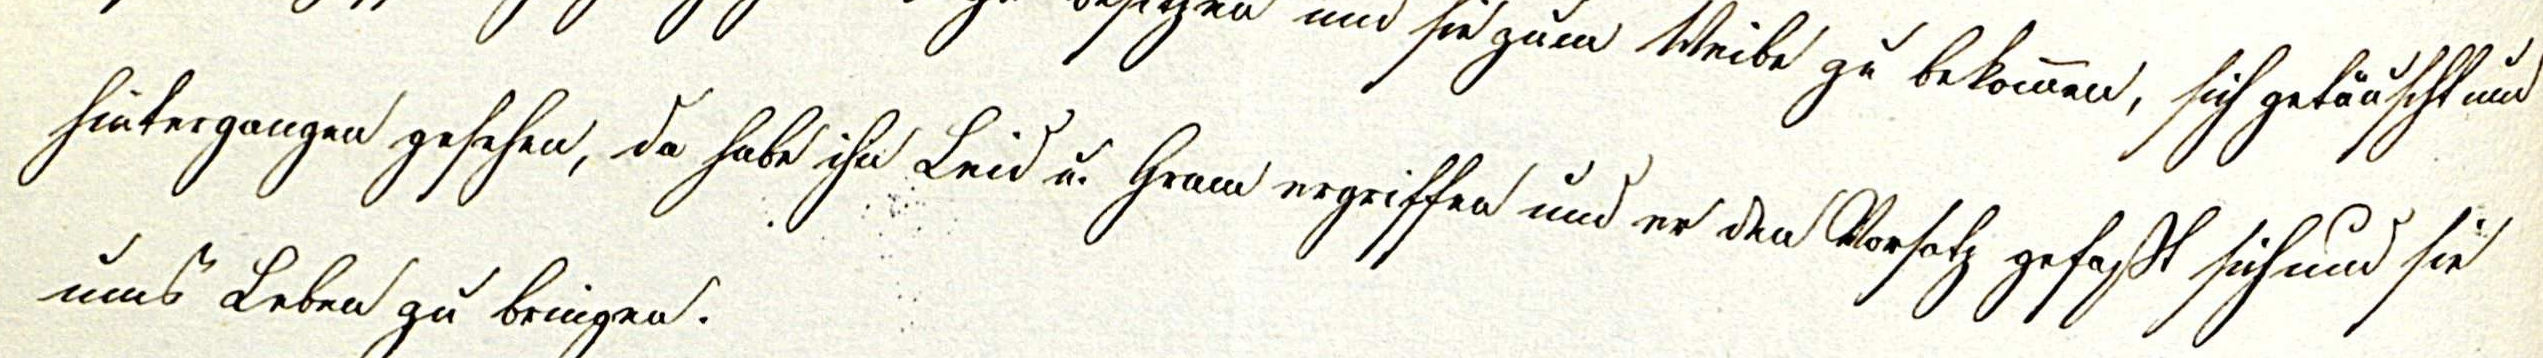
hintergangen gesehen, da habe ihn Leid u. Gram ergriffen und er den Vorsatz gefaßt sich und sie
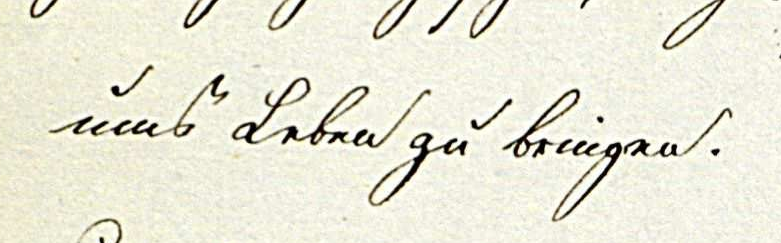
ums Leben zu bringen.
